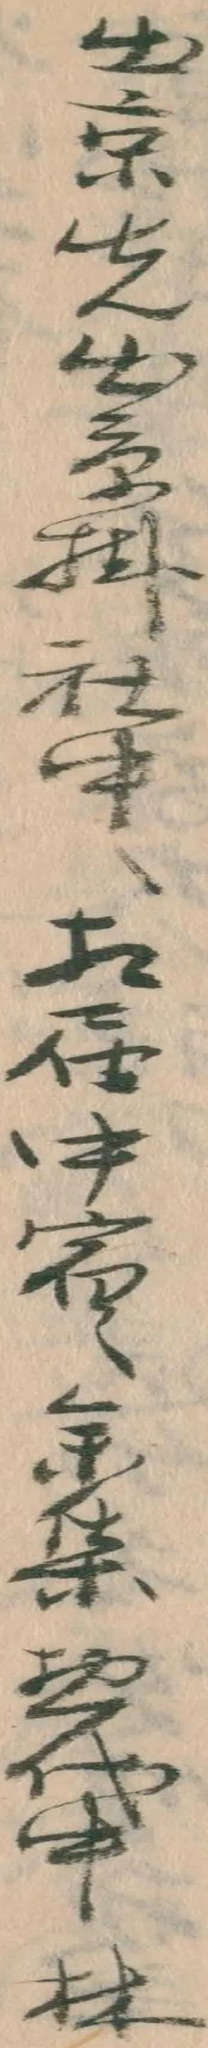出京先出京掛社中へ相届中宿へ参集惣代中林
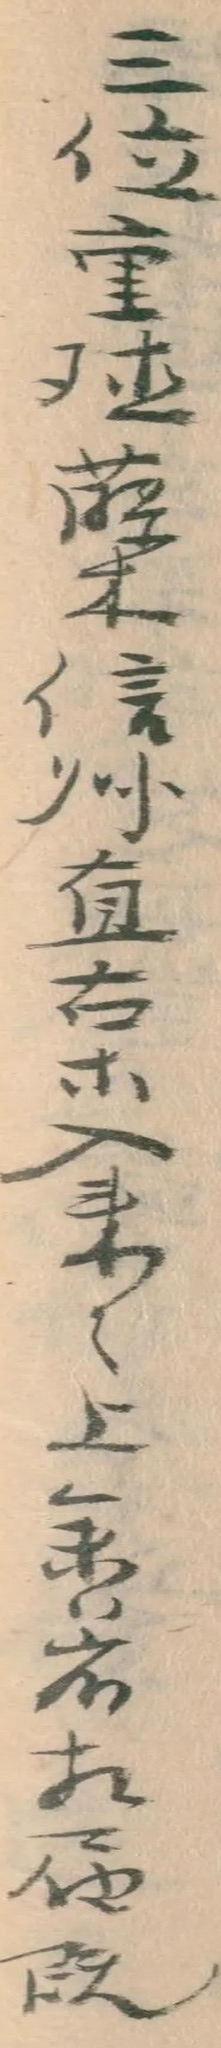三位重殖藤木信州直古等入来之上参御宿相届既
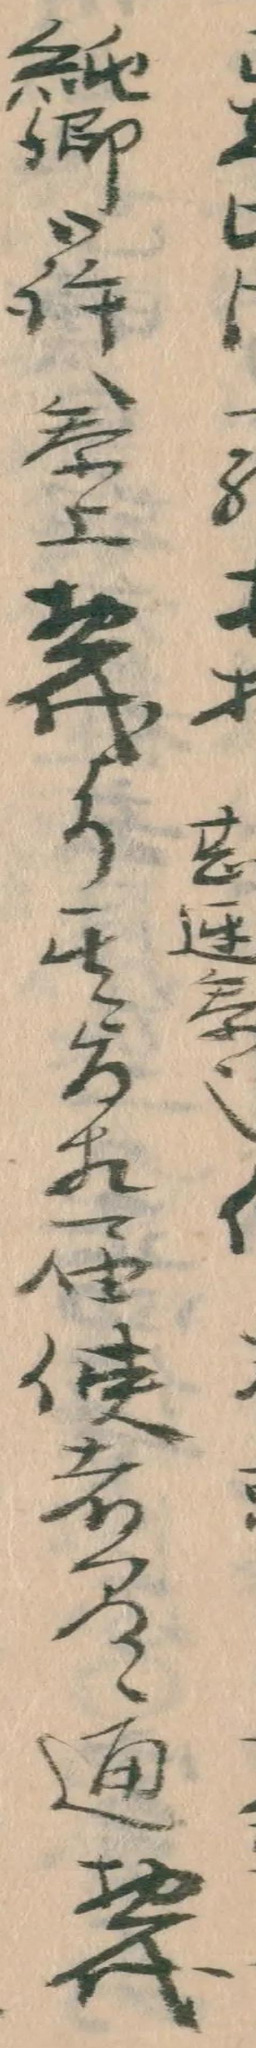純卿御許へ参上惣代より其旨相届使者間々通惣代
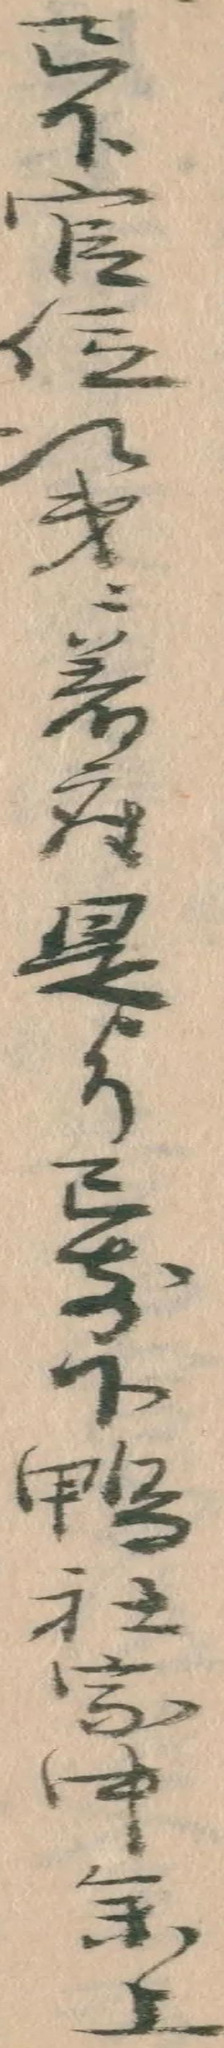已下官位次第ニ着座是より已前下鴨社家中参上
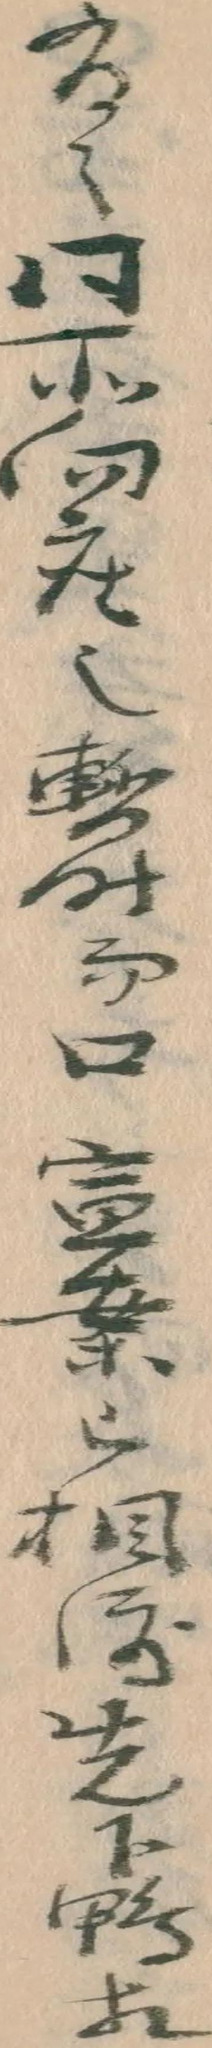有之同所向座也暫時而口宣案被相渡先下鴨相
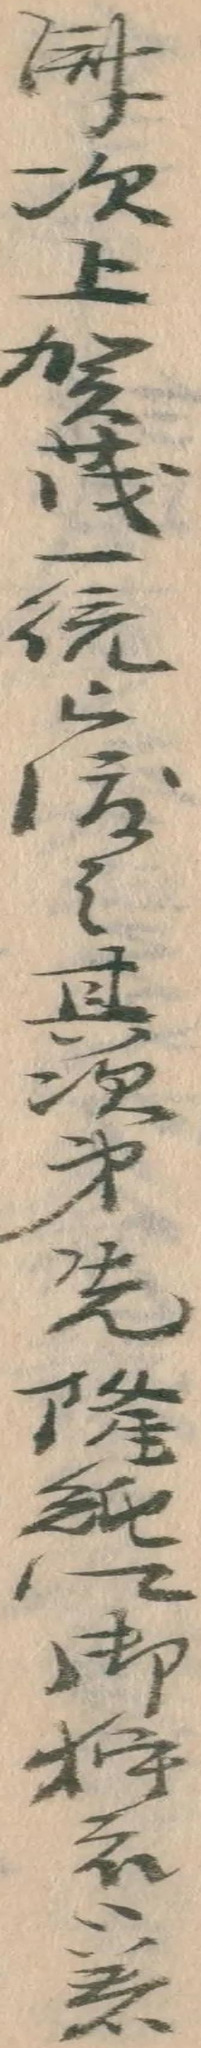済次上賀茂一統被渡之其次第先隆純卿御狩衣御着
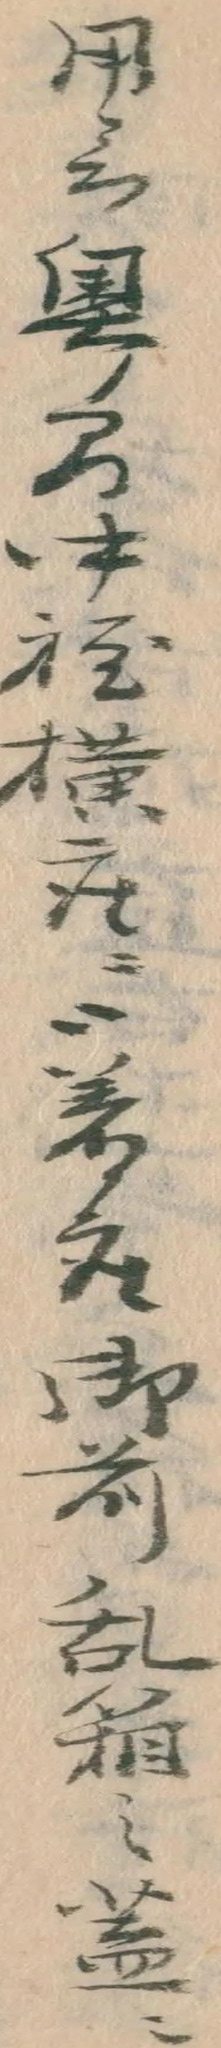用ニ而奥ノ間中程横座ニ御着座御前乱箱之蓋ニ
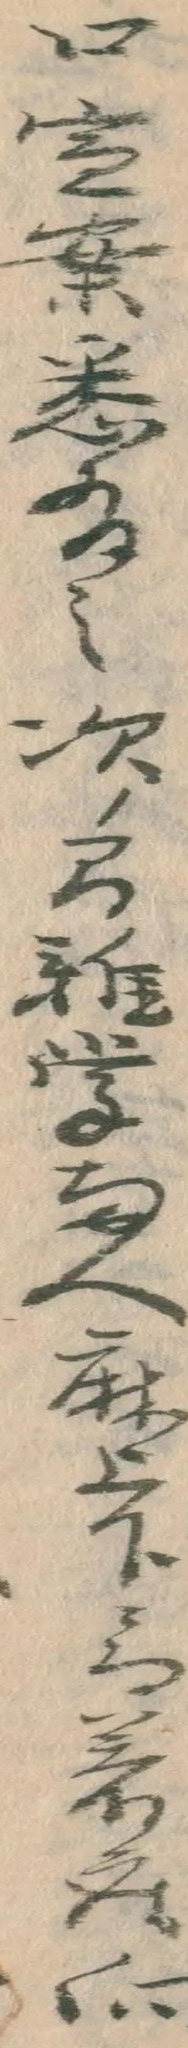口宣案悉有之次ノ間雑掌両人麻上下ニ而着座向
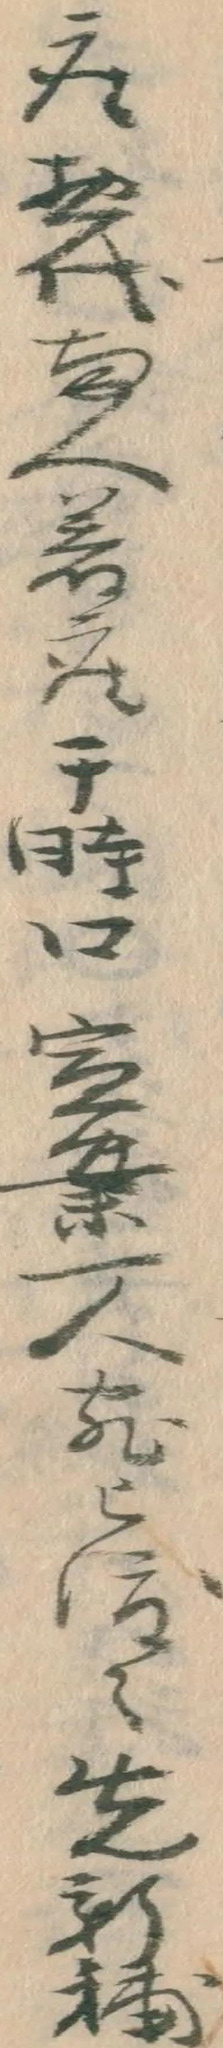座惣代両人着座于時口宣案一人宛被渡之先新補
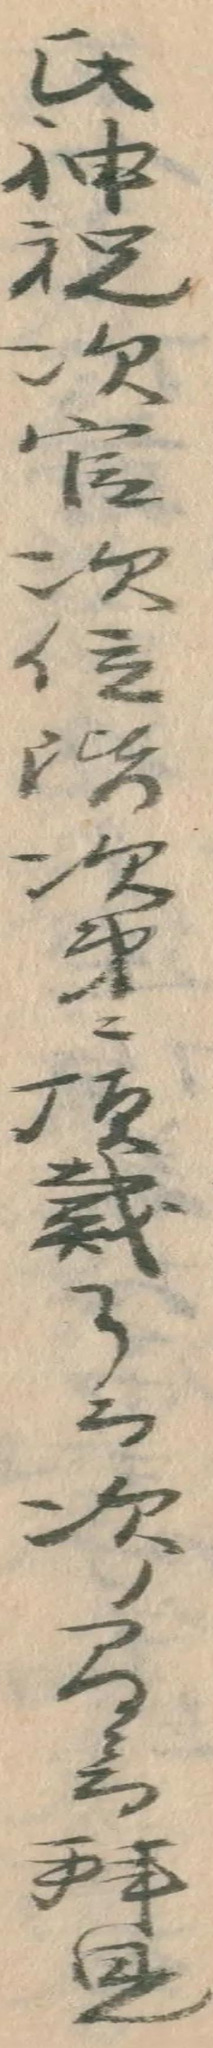氏神祝次官次位階次第ニ頂戴了次ノ間ニ而拝見
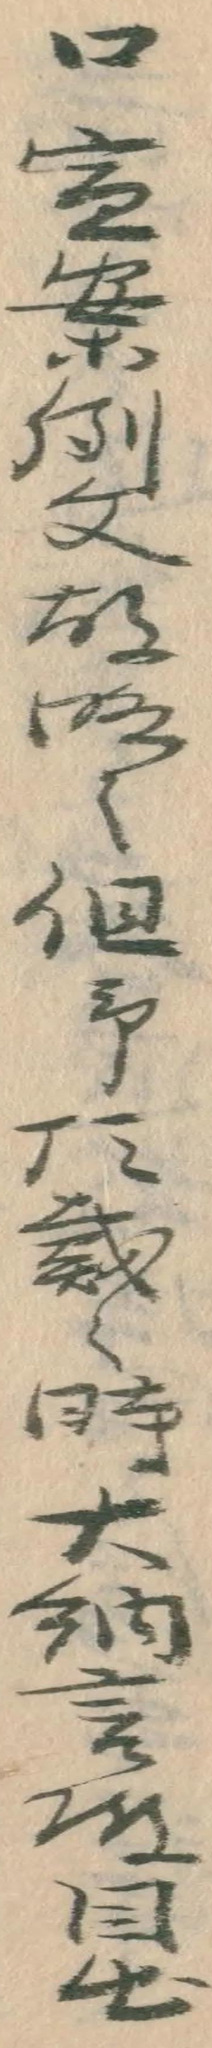口宣案例文故略也但予頂戴之時大納言殿目出
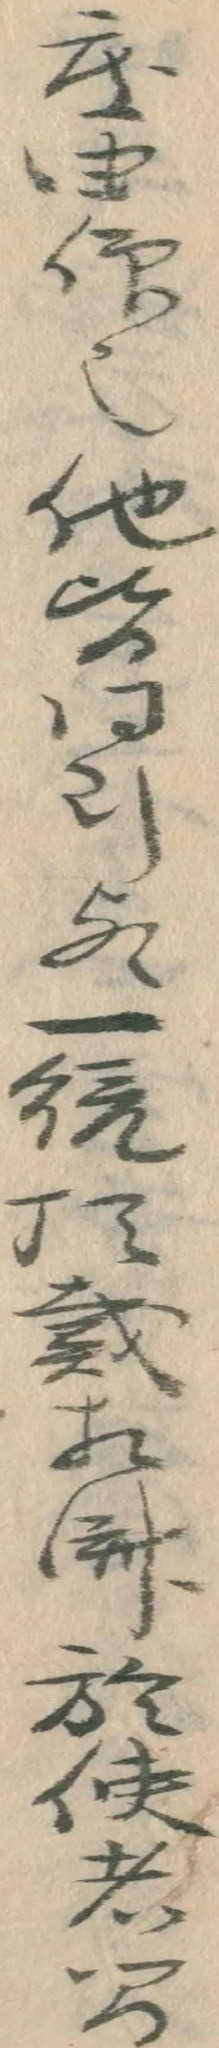度由仰也他皆同断歟一統頂戴相済於使者間
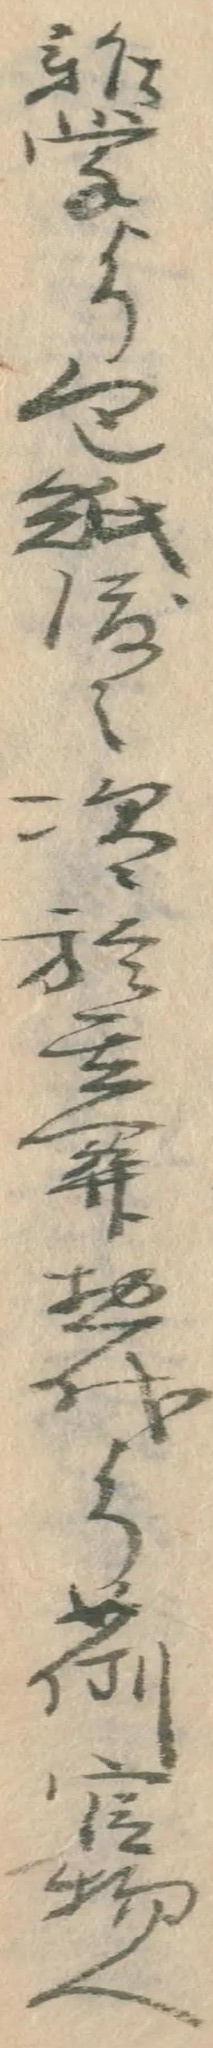雑掌より包紙渡之次ニ於玄関惣代より如例官物人

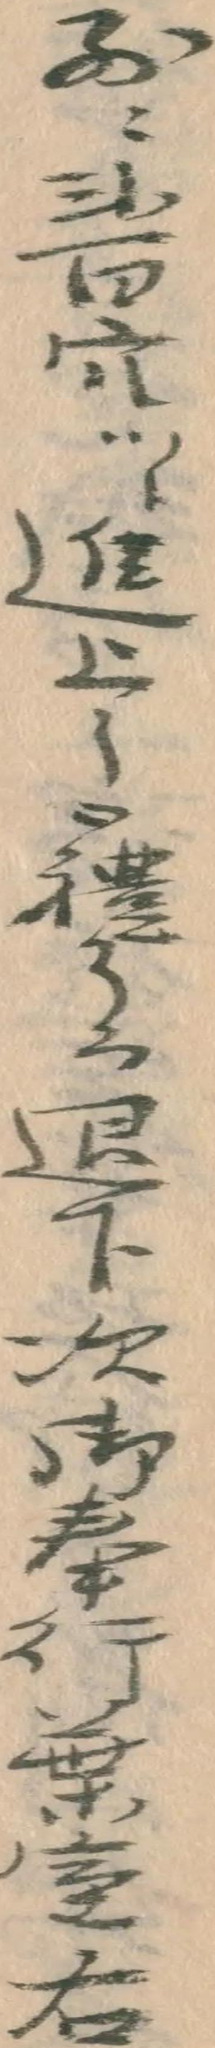前ニ弐百穴ツヽ進上之御禮了而退下次御奉行葉室右
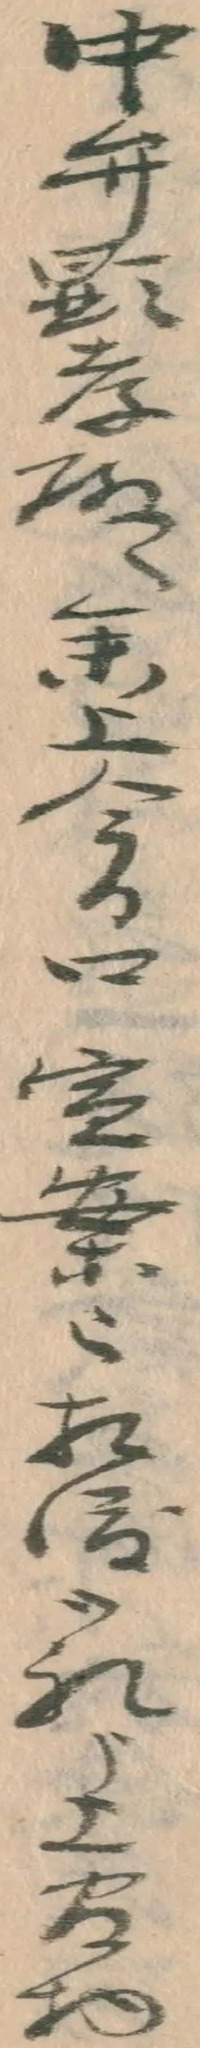中弁顕孝殿へ参上今日口宣案被相渡御礼申上官物
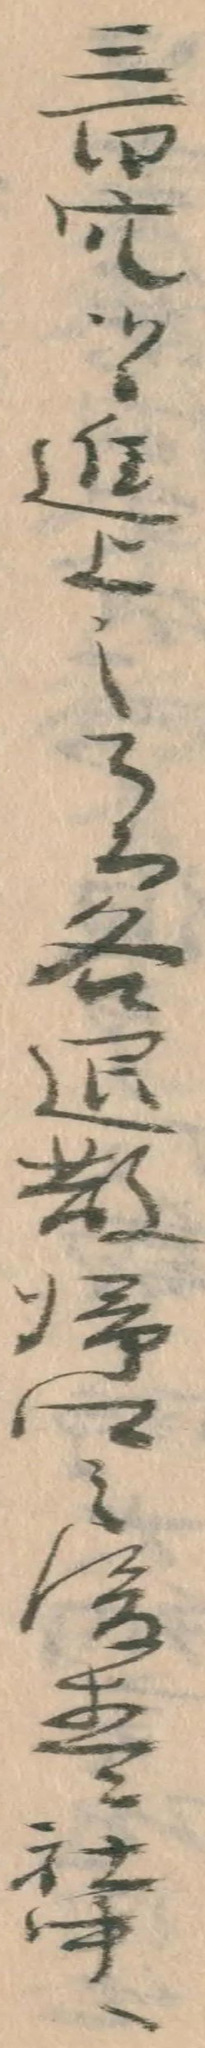三百穴ツヽ進上也了而各退散帰郷之後直ニ社中へ
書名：賀茂社記録. 第63冊
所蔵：国立国会図書館 National Diet Library, JAPAN
